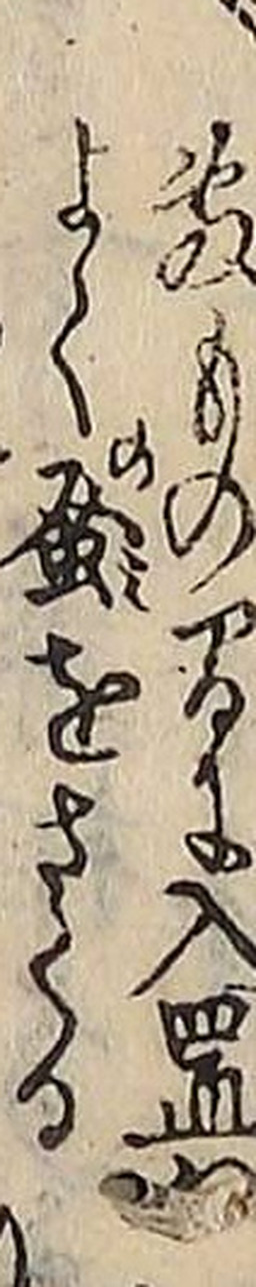よく蚤をさくる
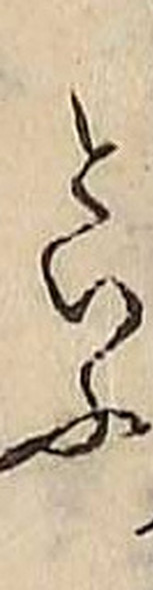といふ

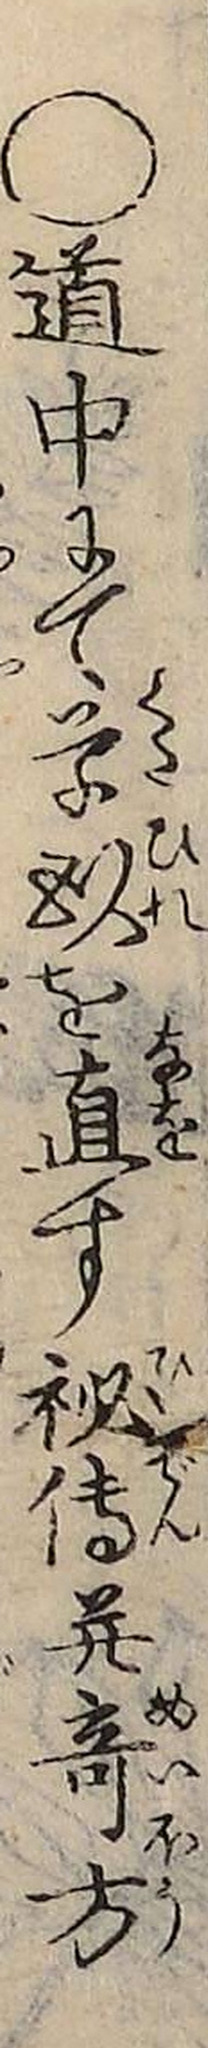○道中にて草臥を直す秘伝并奇方
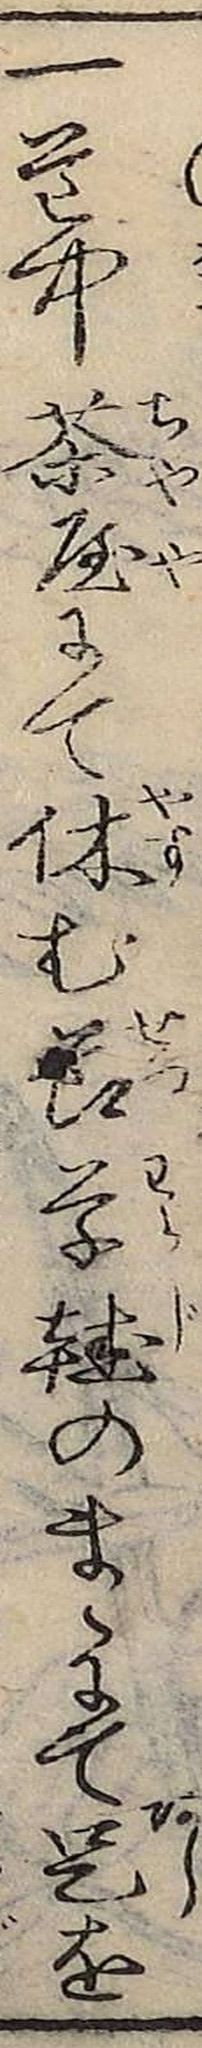一道中茶屋にて休む節草鞋のまゝにて足を
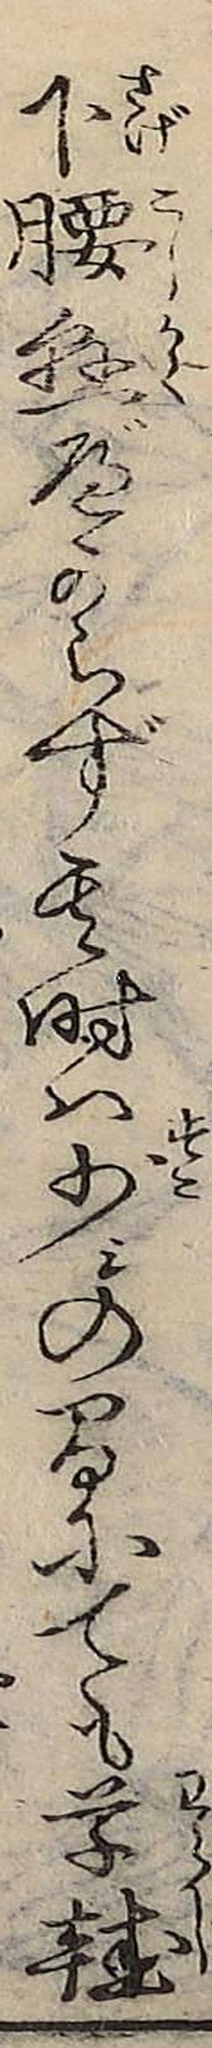下腰懸べからず其時は少間にても草鞋
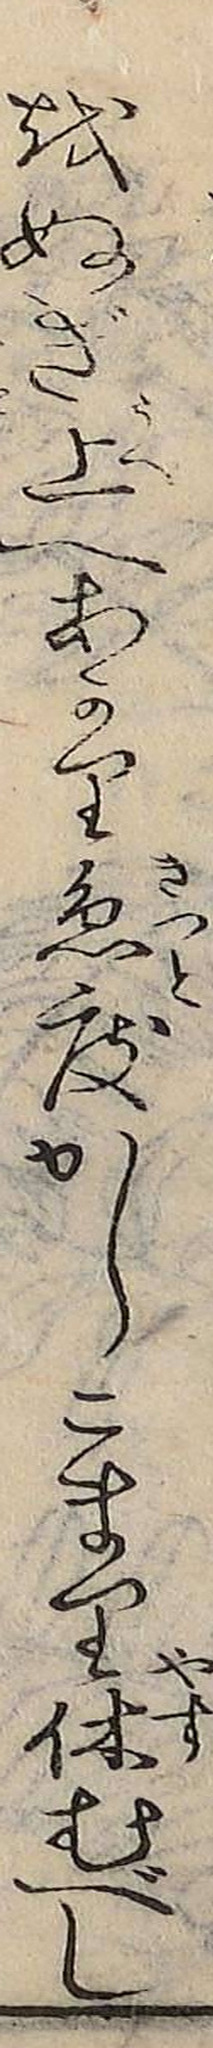をぬぎ上へあかり急度かしこまり休むべし
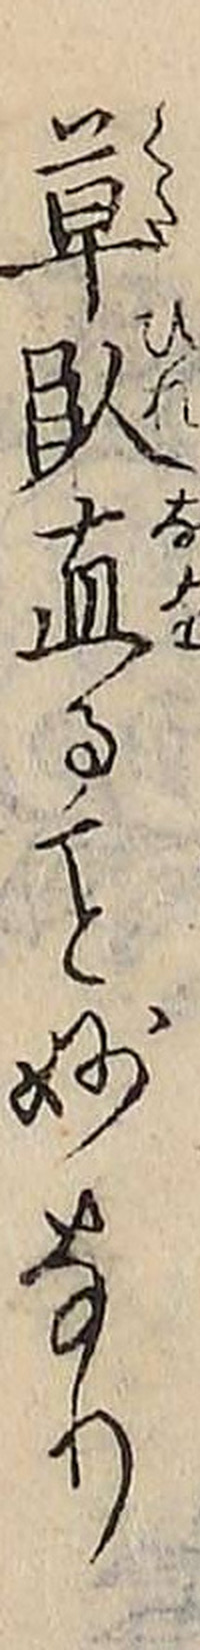草臥直ること妙なり
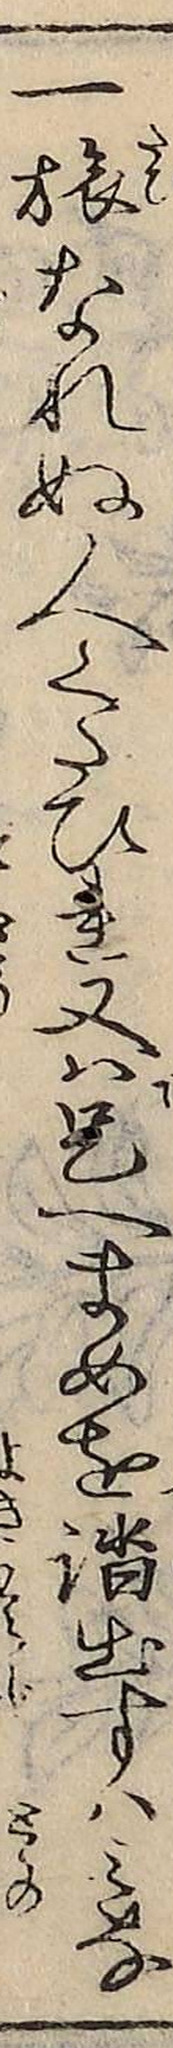一旅なれぬ人くたひれ又は足へまめを踏出すはみな
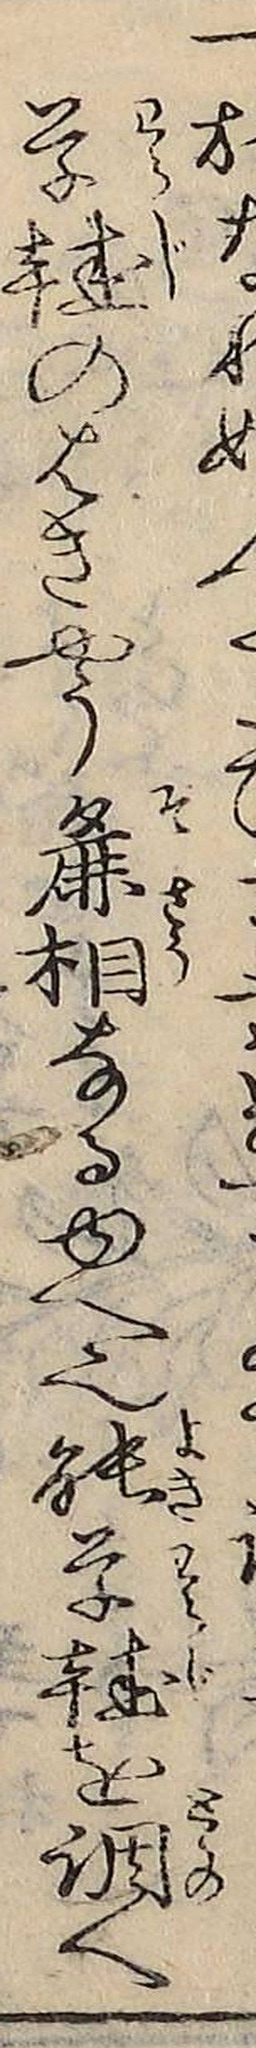草鞋のはきやう麁相なるゆへ也能草鞋を調へ
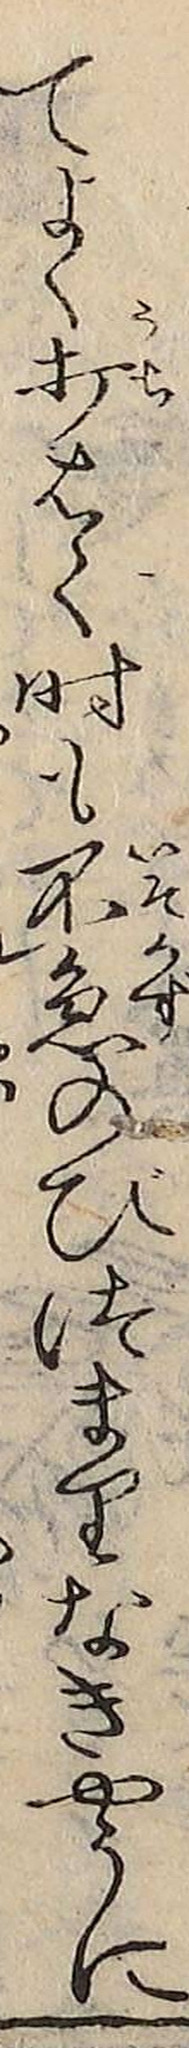てよく打はく時も不急のびつまりなきやうに
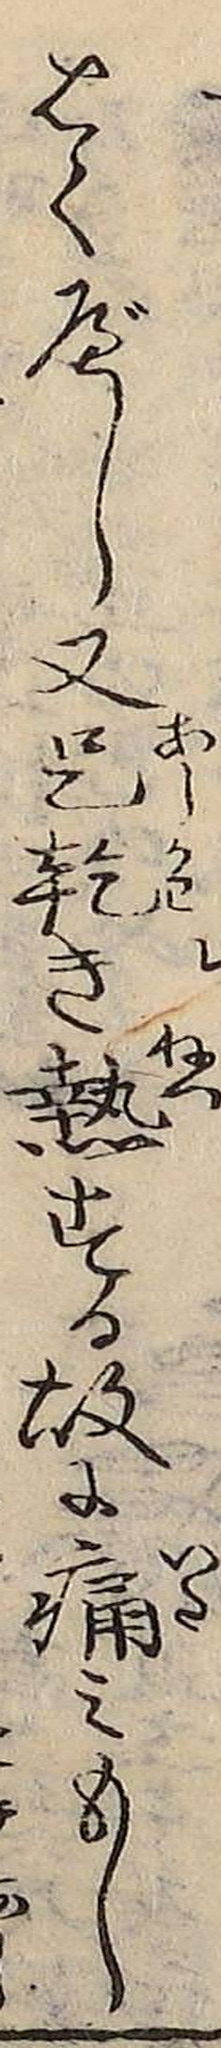はくべし又足乾き熱する故に痛みもし
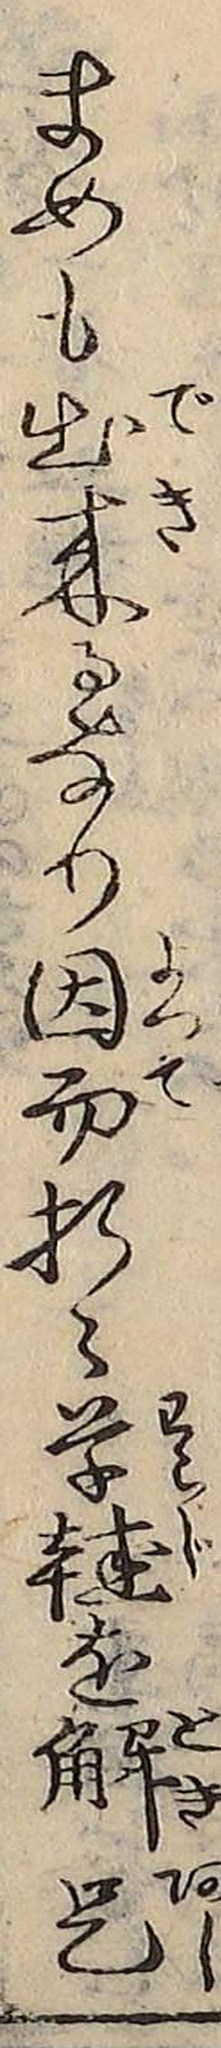まめも出来るなり因而折々草鞋を解足
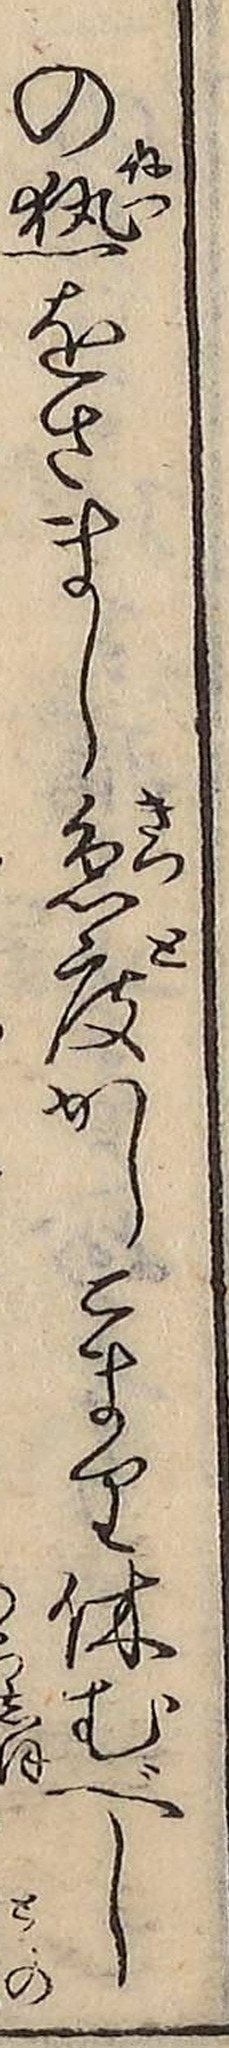の熱をさまし急度かしこまり休むべし
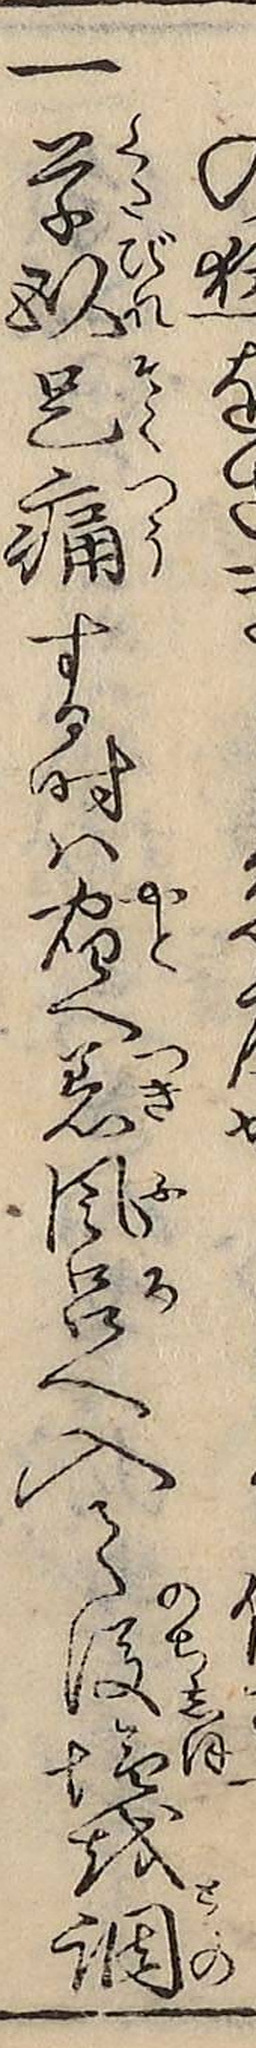一草臥足痛する時は宿へ着風呂へ入て後塩を調
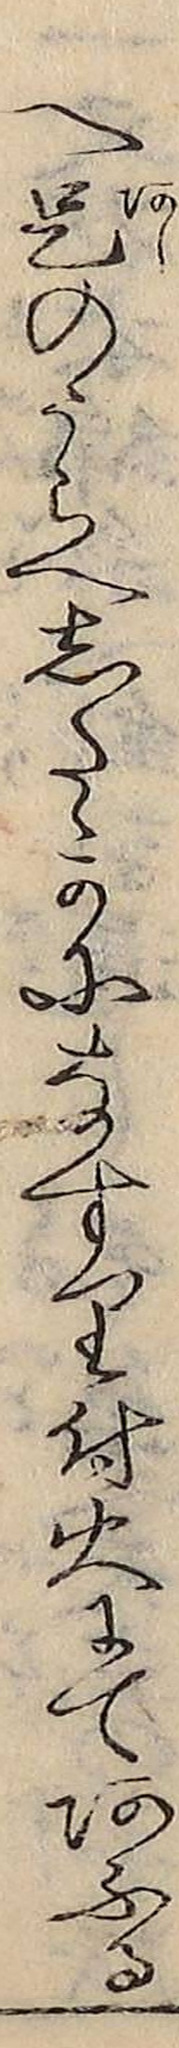へ足のうらへしたゝかになすり付火にてあふる
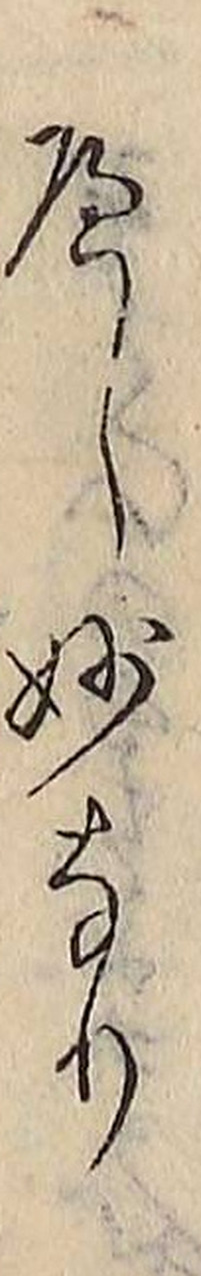へし妙なり
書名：旅行用心集
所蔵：神戸大学附属図書館 国文学研究資料館
